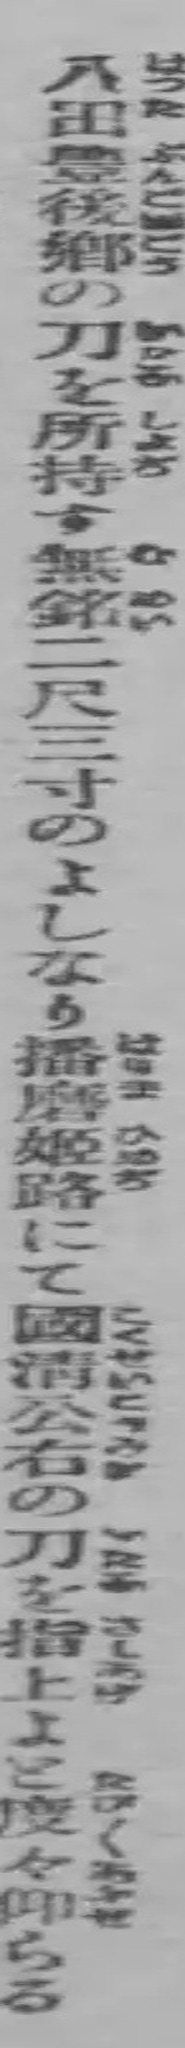八田豊後郷の刀を所持す無銘二尺三寸のよしなり播磨姫路にて国清公右の刀を指上よと度々仰らる
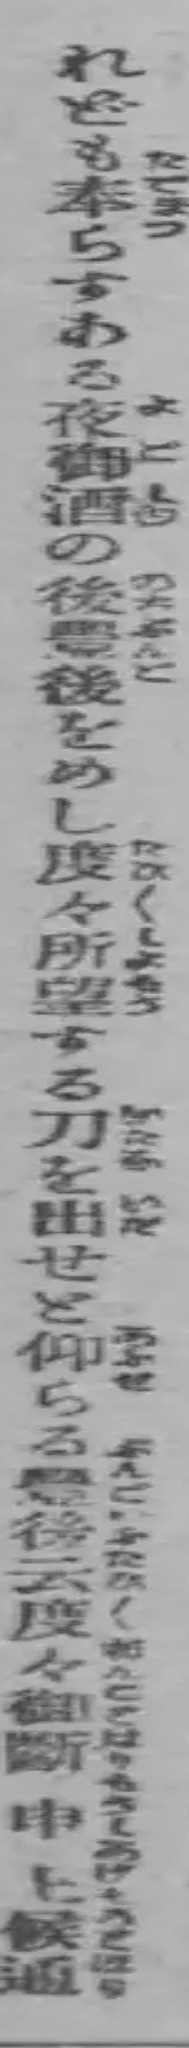れども奉らすある夜御酒の後豊後をめし度々所望する刀を出せと仰らる豊後云度々御断申上候通

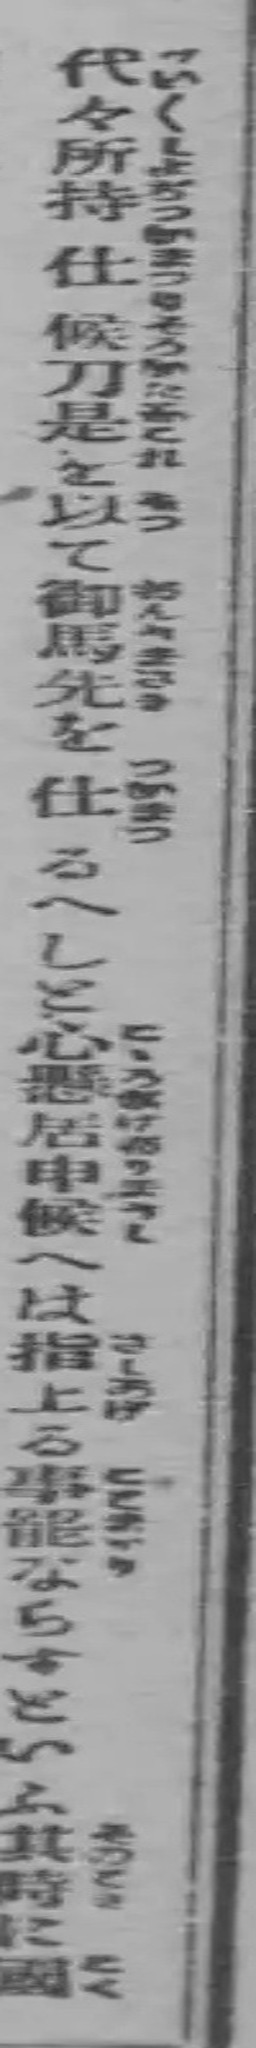代々所持仕候刀是を以て御馬先を仕るへしと心懸居申候へは指上る事罷ならすといふ其時に国
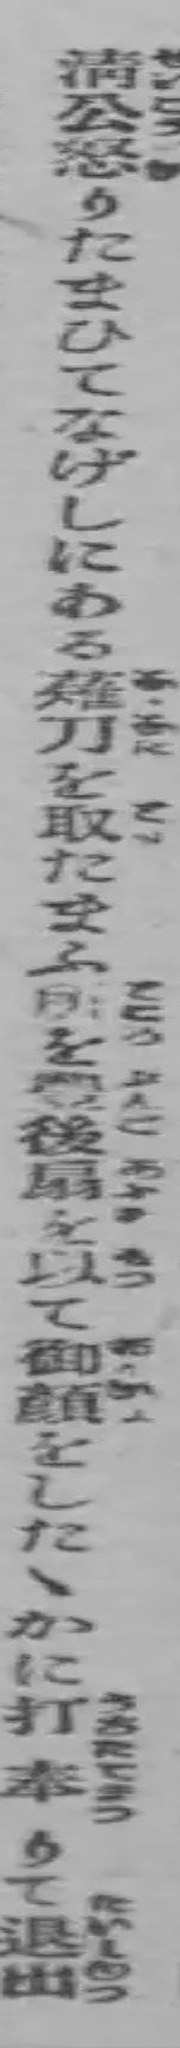清公怒りたまひてなげしにある薙刀を取たまふ所を豊後扇を以て御顔をしたゝかに打奉りて退出
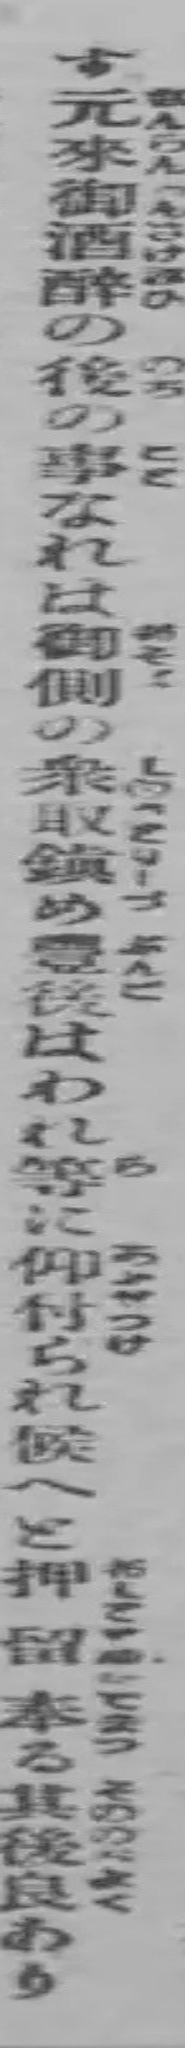す元来御酒酔の後の事なれは御側の衆取鎮め豊後はわれ等に仰付られ候へと押留奉る其後良あり
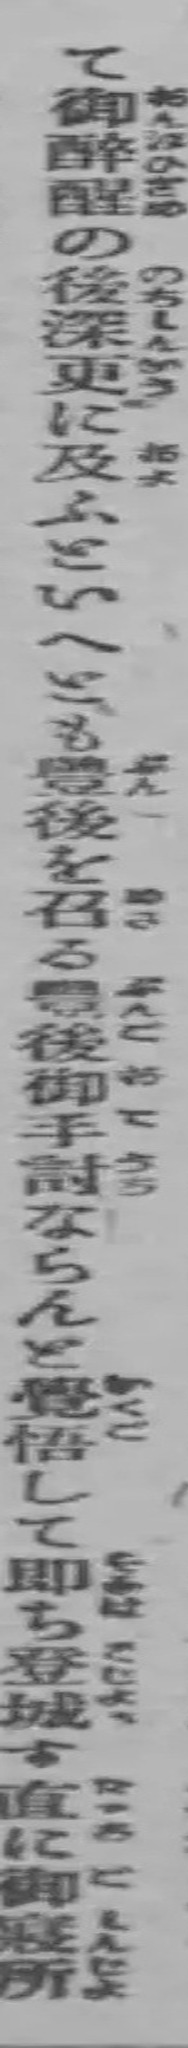て御酔醒の後深更に及ふといへとも豊後を召る豊後御手討ならんと覚悟して即ち登城す直に御寝所
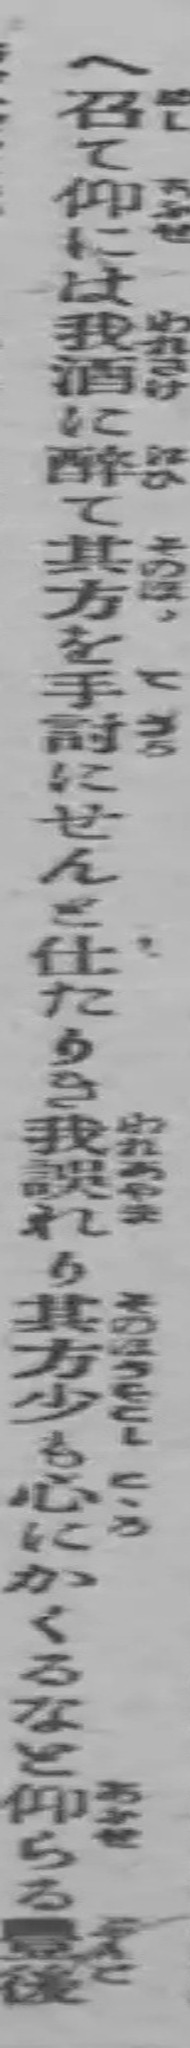へ召て仰には我酒に酔て其方を手討にせんと仕たりき我誤れり其方少も心にかくるなと仰らる豊後
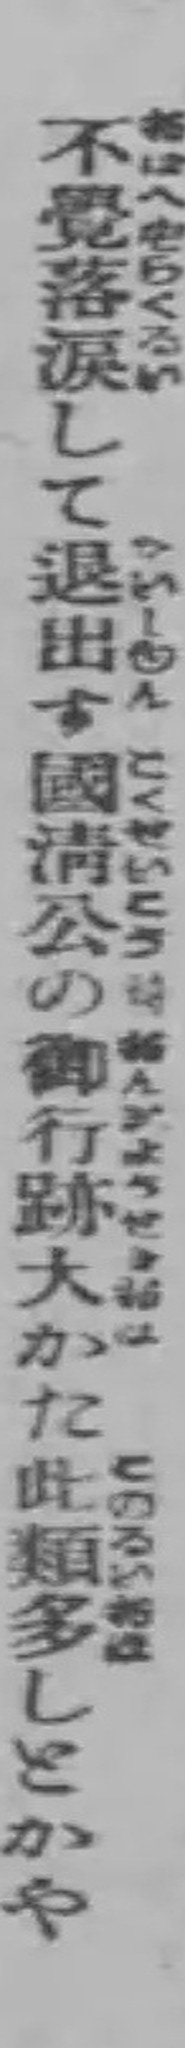不覚落涙して退出す国清公の御行跡大かた此類多しとかや
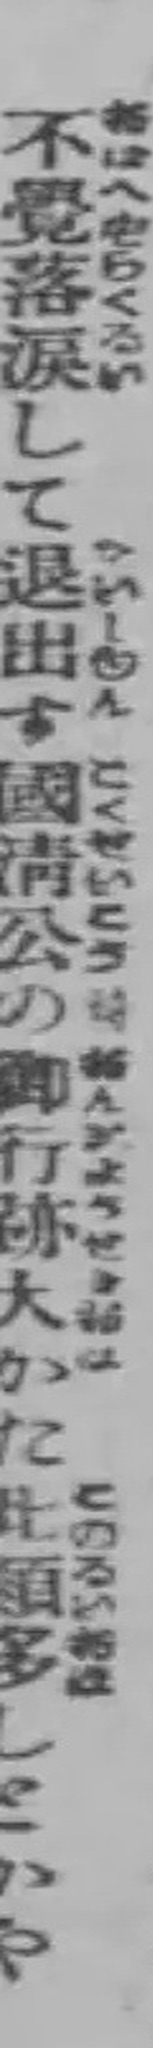不覚落涙して退出す国清公の御行跡大かた此類多しとかや
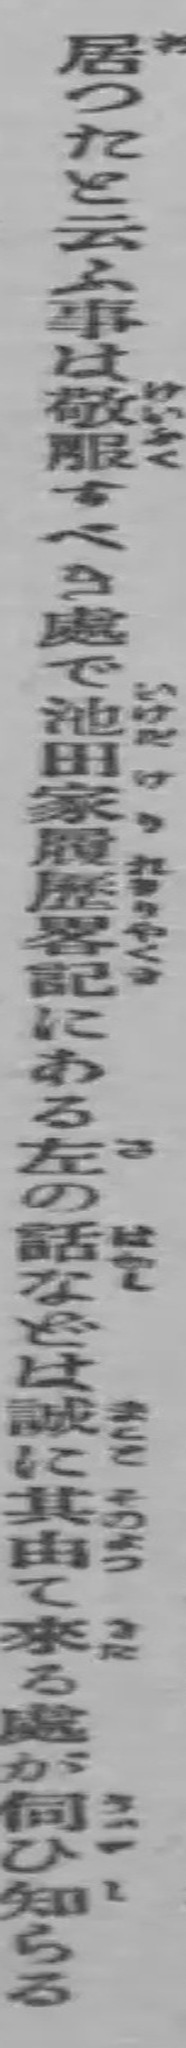居つたと云ふ事は敬服すべき処で池田家履歴略記にある左の話などは誠に其由て来る処が伺ひ知らる
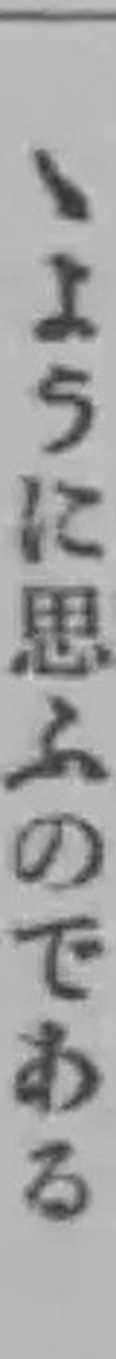ゝように思ふのである
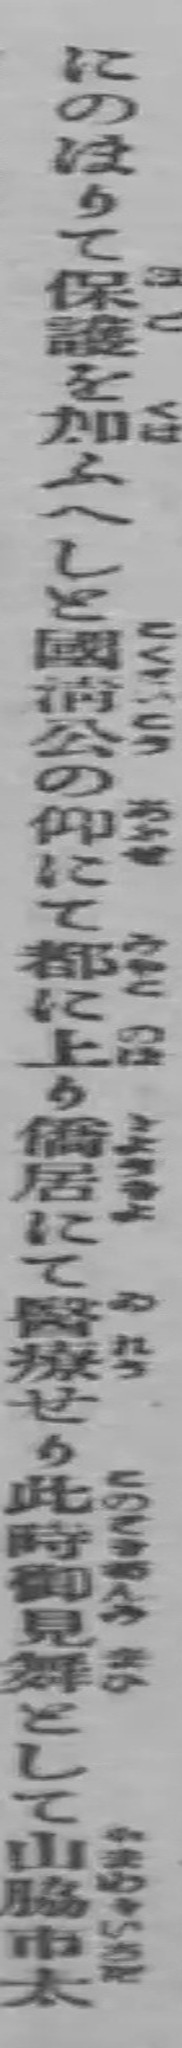にのほりて保護を加ふへしと国清公の仰にて都に上り僑居にて医療せり此時御見舞として山脇市太
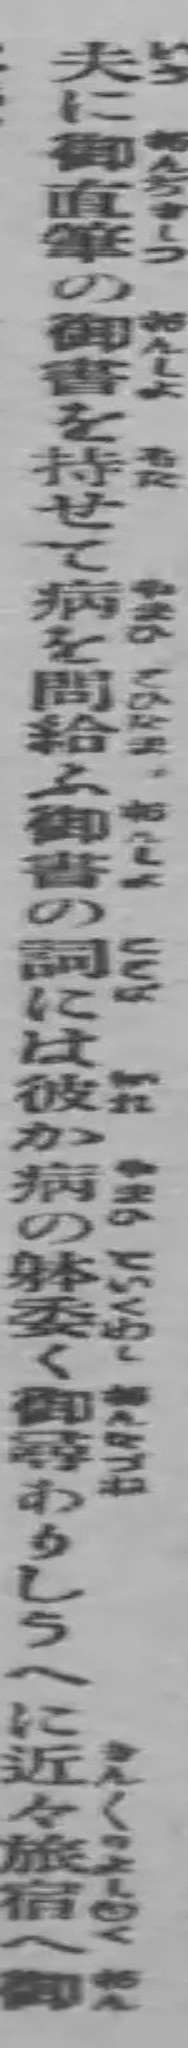夫に御直筆の御書を持せて病を問給ふ御書の詞には彼か病の躰委く御尋ありしうへに近々旅宿へ御
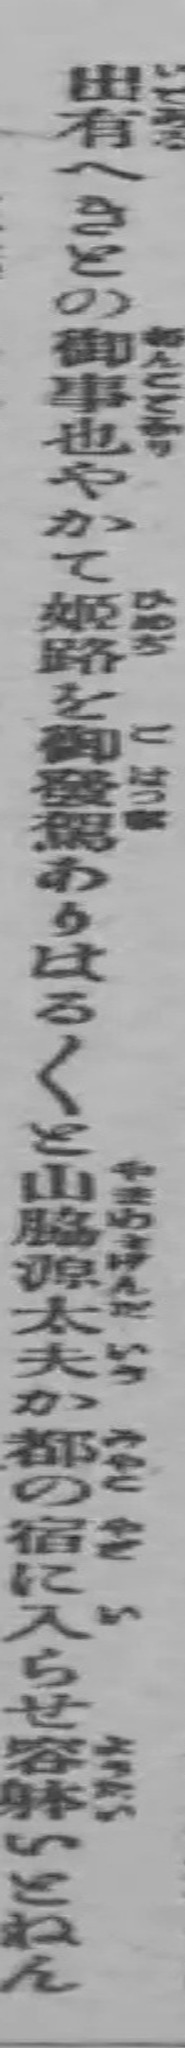出有へきとの御事也やかて姫路を御発駕ありはる〳〵と山脇源太夫か都の宿に入らせ容躰いとねん
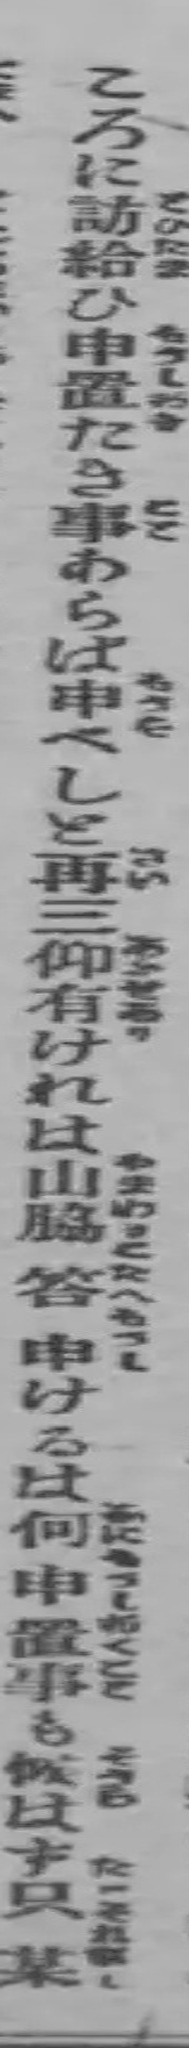ころに訪給ひ申置たき事あらば申べしと再三仰有けれは山脇答申けるは何申置事も候はず只某
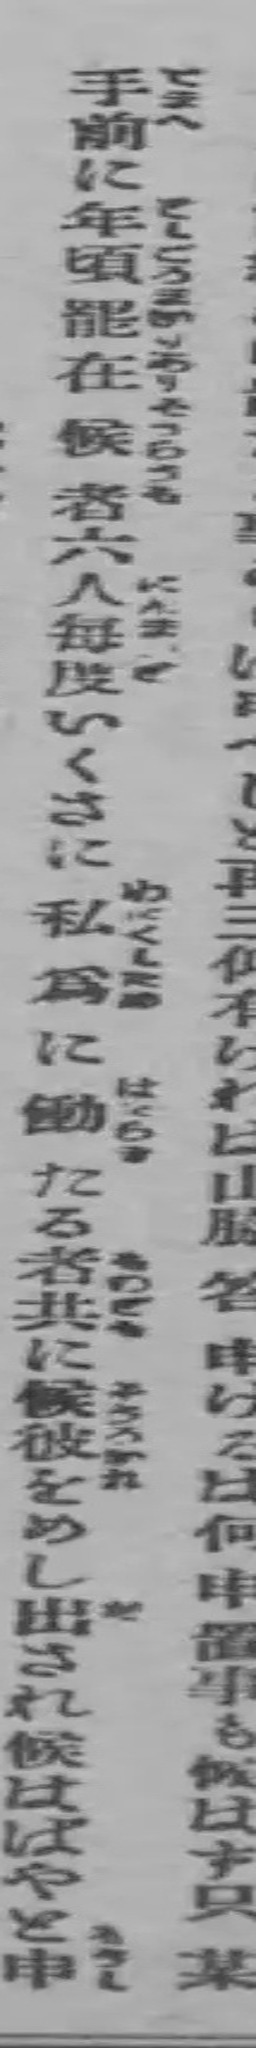手前に年頃罷在候者六人毎度いくさに私為に働たる者共に候彼をめし出され候はばやと申
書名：豊橋市史談
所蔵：国立国会図書館 National Diet Library, JAPAN
